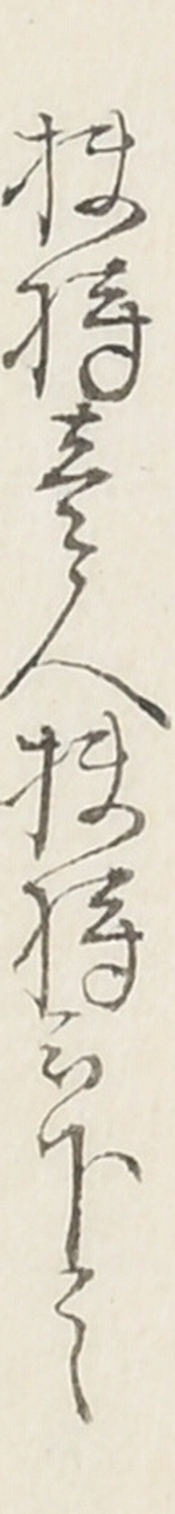扶持壱人扶持被下之
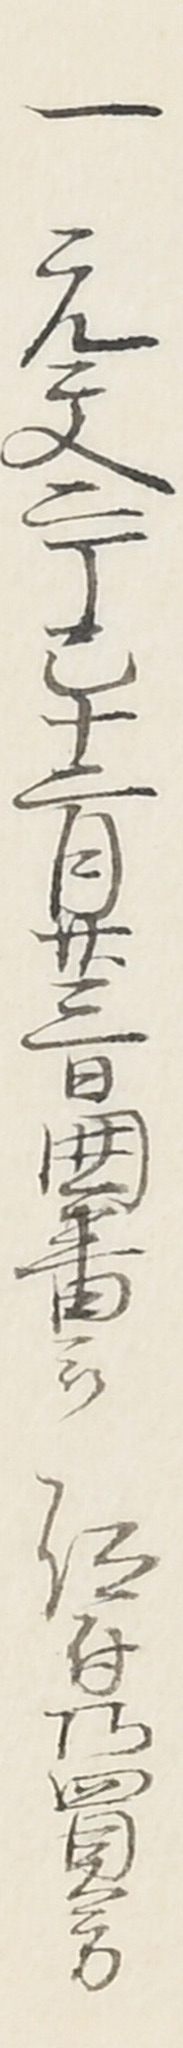一元文二丁巳十二月廿三日囲番被仰付御買方
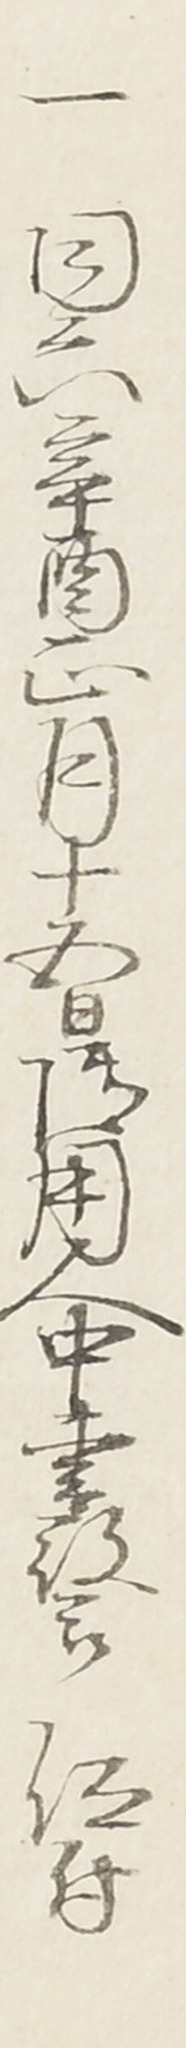一同六辛酉正月十五日御用人中書役被仰付
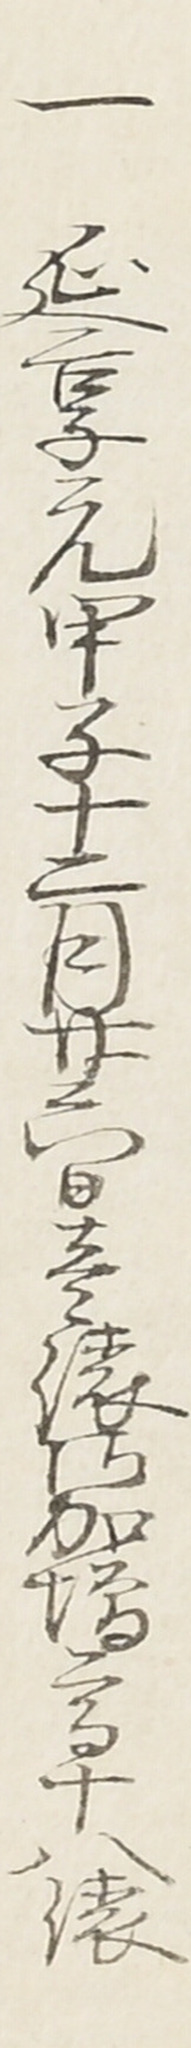一延享元甲子十二月廿六日壱俵御加増高十八俵
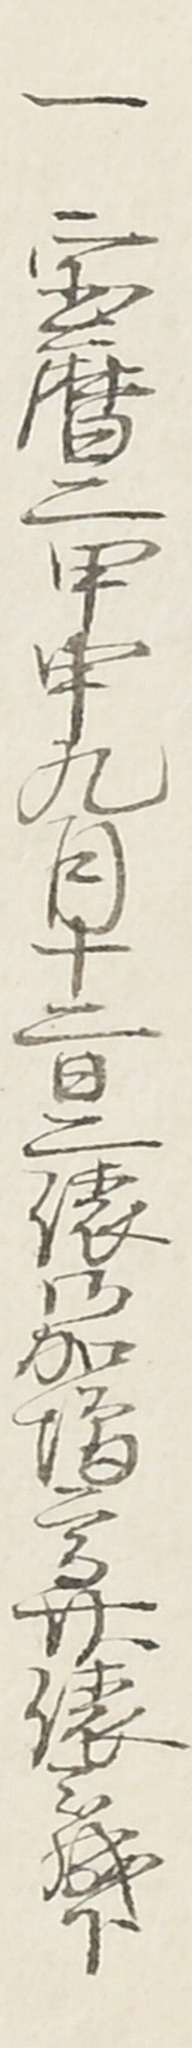一宝暦ニ甲申九月十二日二俵御加増高廿俵被成下
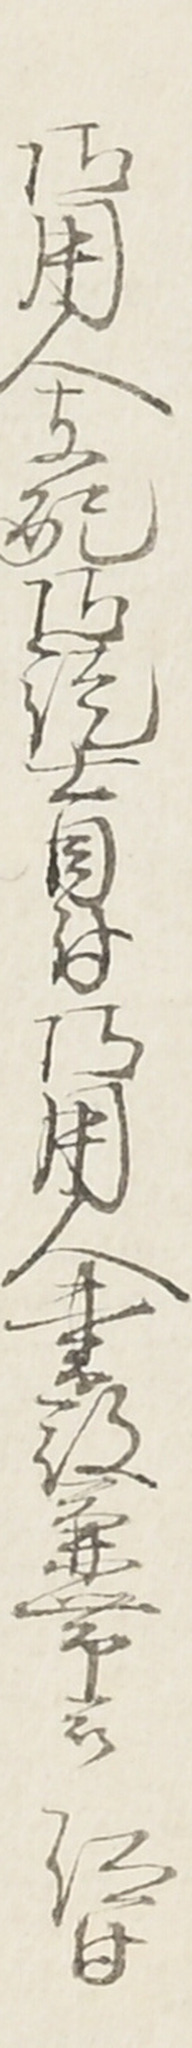御用人支配御徒士目付御用人書役兼帯被仰付
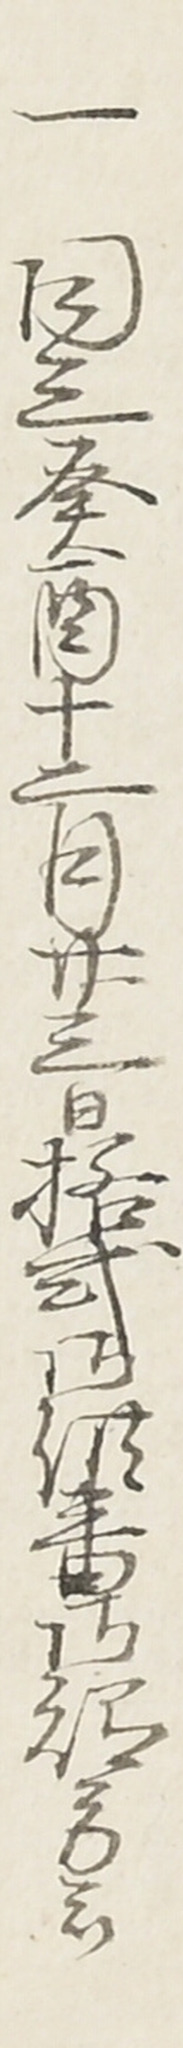一同三癸酉十二月廿三日格式御供番御賄方被
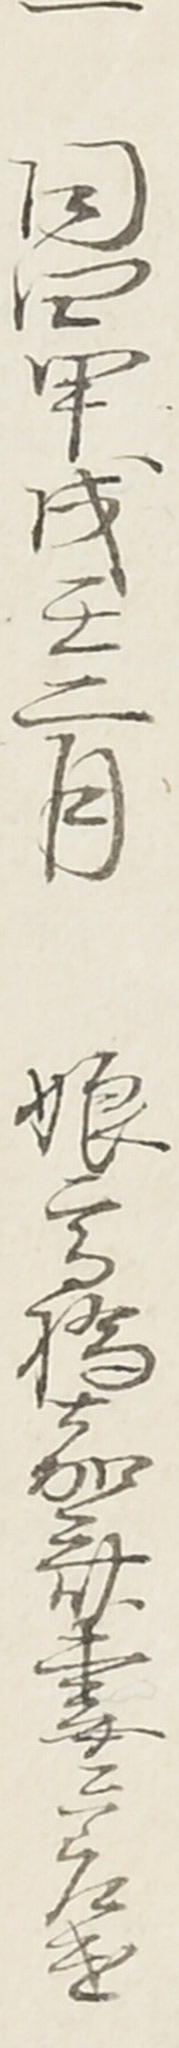一同四甲戌閏三月娘高橋嘉斎妻ニ差遣
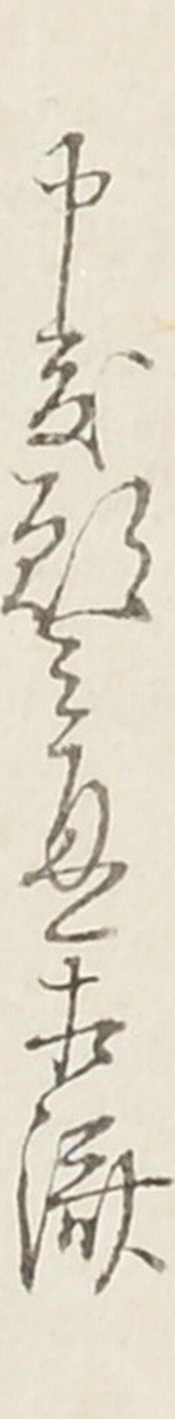申度願之通相済
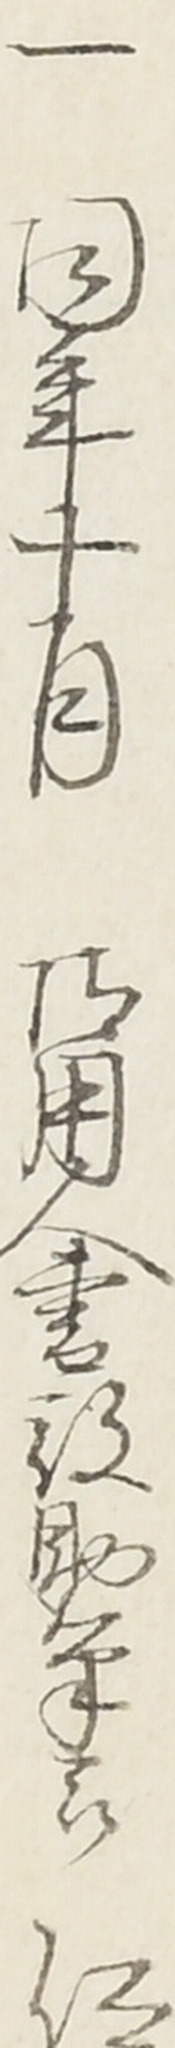一同年十月御用人書役助筆被仰付
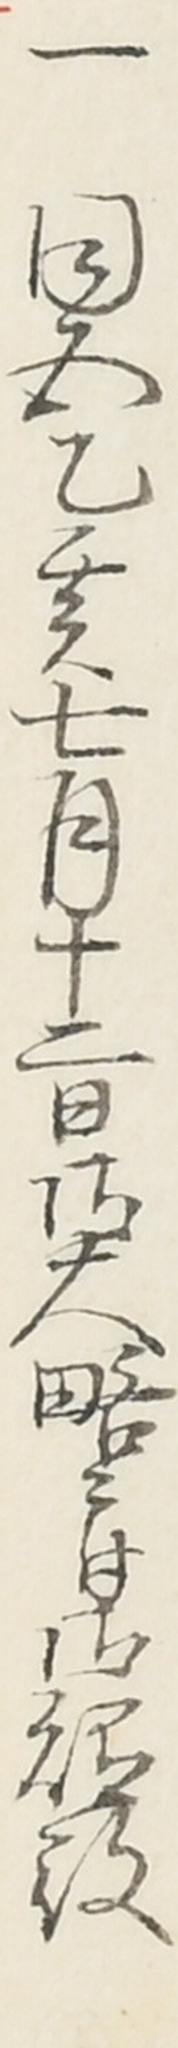一同五乙亥七月十二日御大略ニ付御賄役

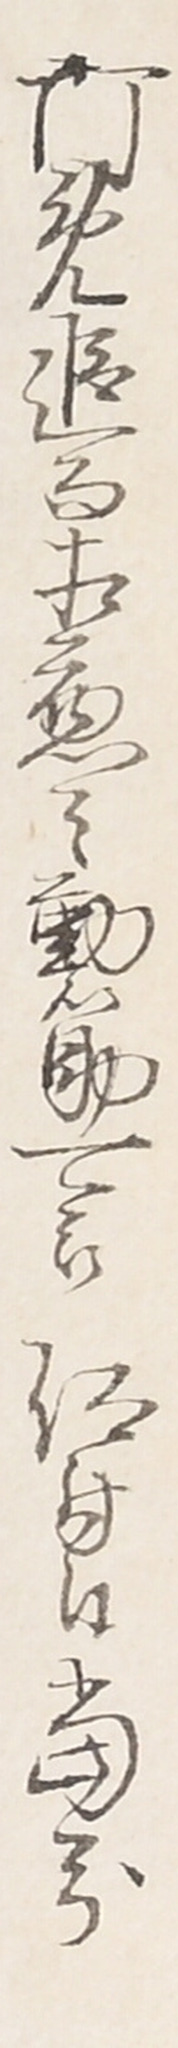御免追而相応之勤筋可被仰付候当分
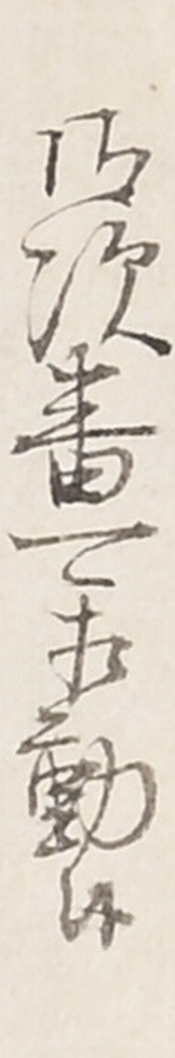御次番可相勤候
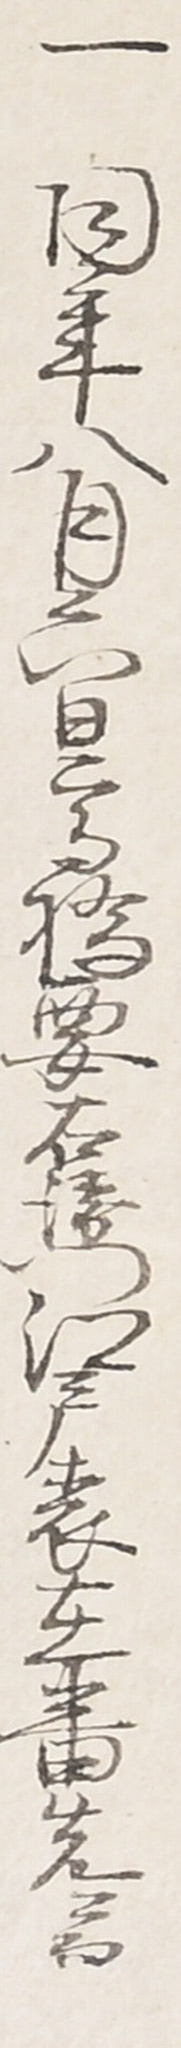一同年八月六日高橋要右衛門江戸表在番先ニ而
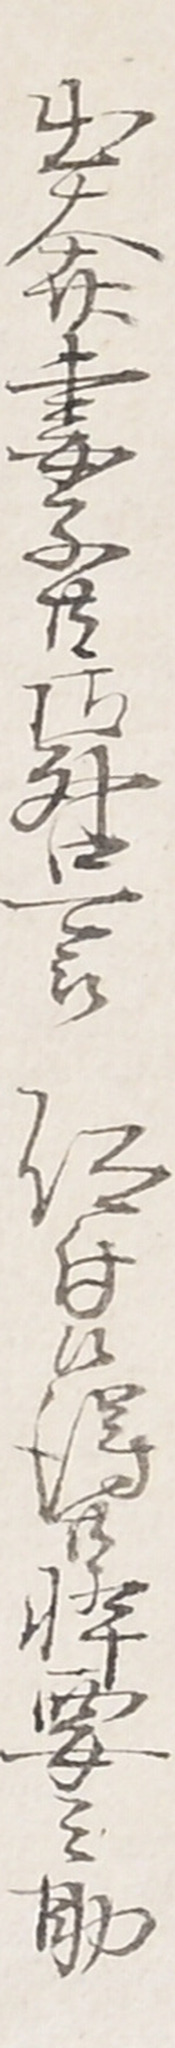出奔妻子共御咎可被仰付候得共忰要之助
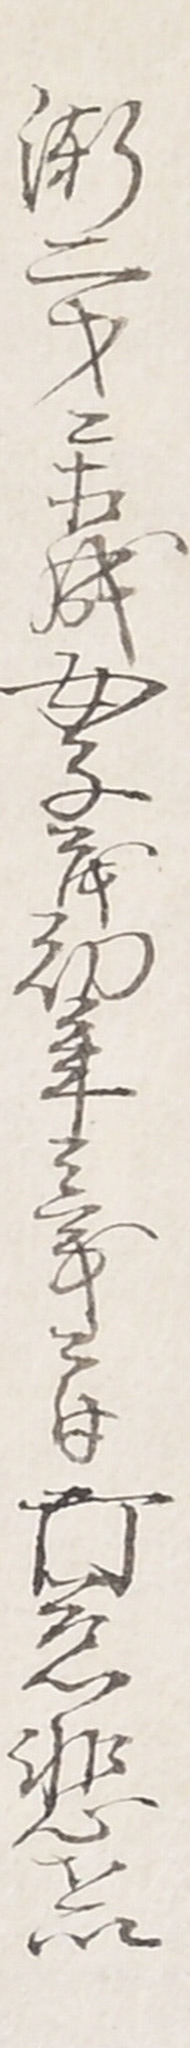漸二才ニ相成女子茂幼年之義ニ付御慈悲を以
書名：無足諸士勤仕録（四）
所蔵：伊那市立高遠町図書館・合同会社AMANE
